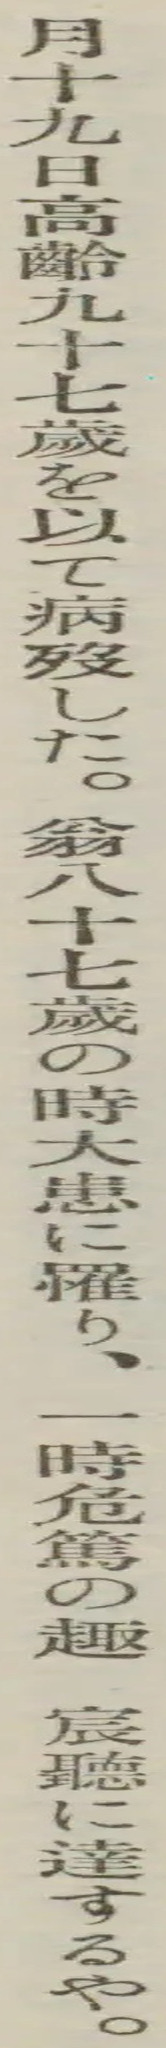月十九日高齢九十七歳を以て病歿した。翁八十七歳の時大患に罹り、一時危篤の趣宸聴に達するや。
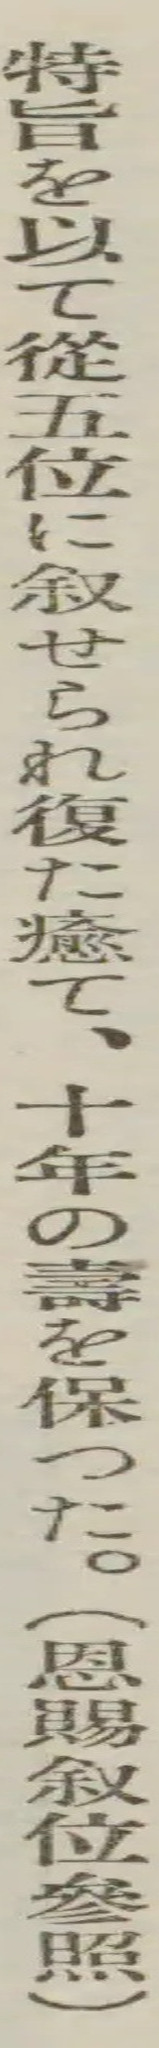特旨を以て従五位に叙せられ復た癒て、十年の寿を保つた。(恩賜叙位参照)
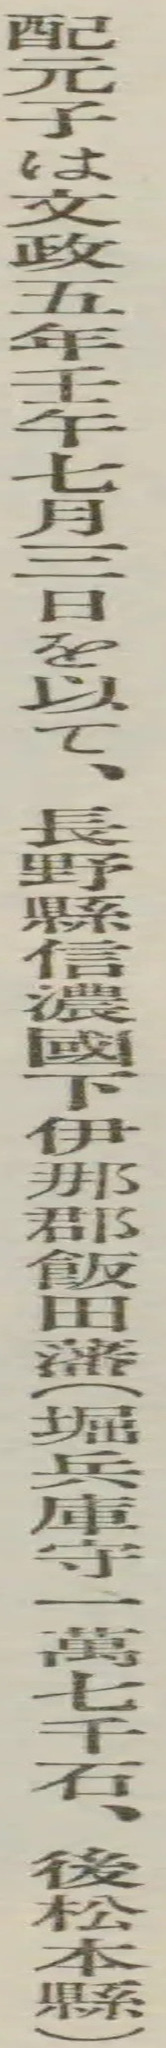配元子は文政五年壬午七月三日を以て、長野県信濃国下伊那郡飯田藩(堀兵庫守一万七千石、後松本県)
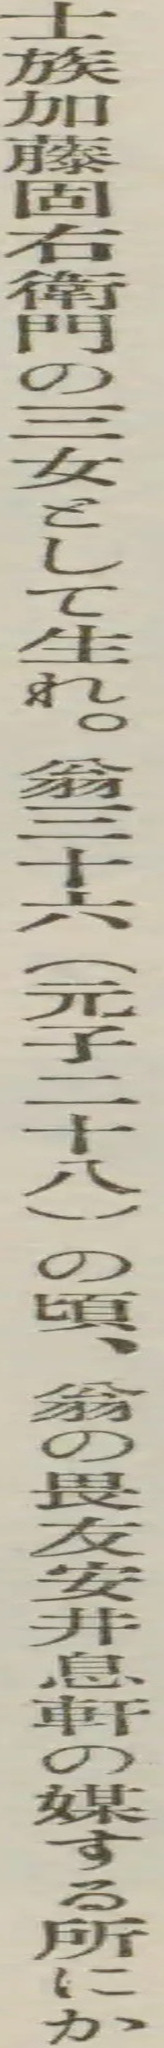士族加藤固右衛門の三女として生れ。翁三十六(元子二十八)の頃、翁の畏友安井息軒の媒する所にか
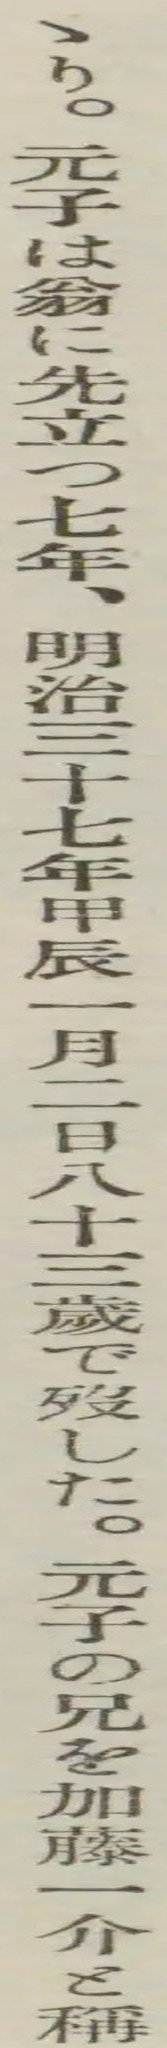ゝり。元子は翁に先立つ七年、明治三十七年甲辰一月二日八十三歳で歿した。元子の兄を加藤一介と称
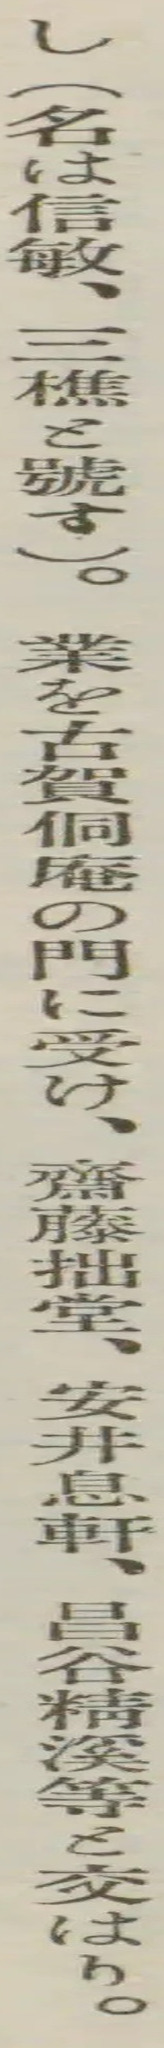し(名は信敏、三樵と号す)。業を古賀侗庵の門に受け、齋藤拙堂、安井息軒、昌谷精渓等と交はり。
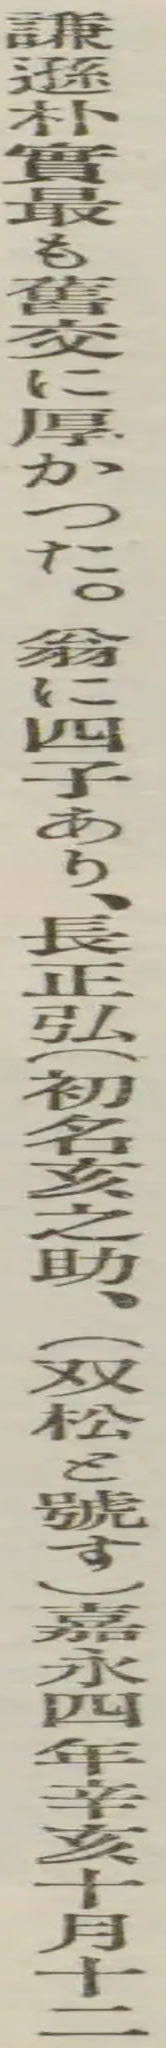謙遜朴実最も旧交に厚かつた。翁に四子あり、長正弘(初名亥之助、(双松と号す)嘉永四年辛亥十月十二
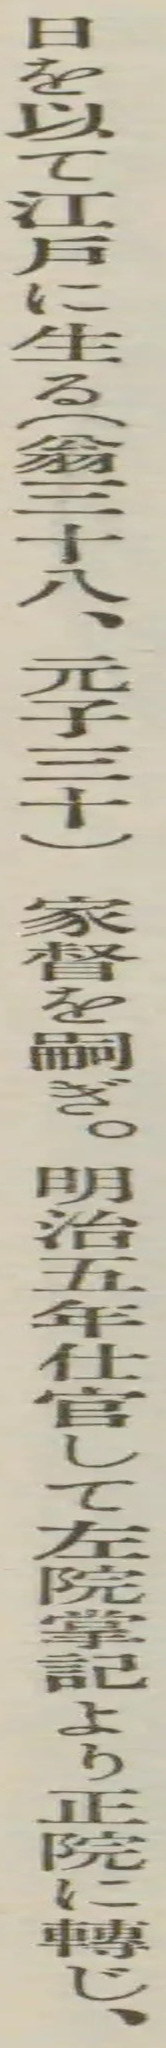日を以て江戸に生る(翁三十八、元子三十)家督を嗣ぎ。明治五年仕官して左院掌記より正院に転じ、
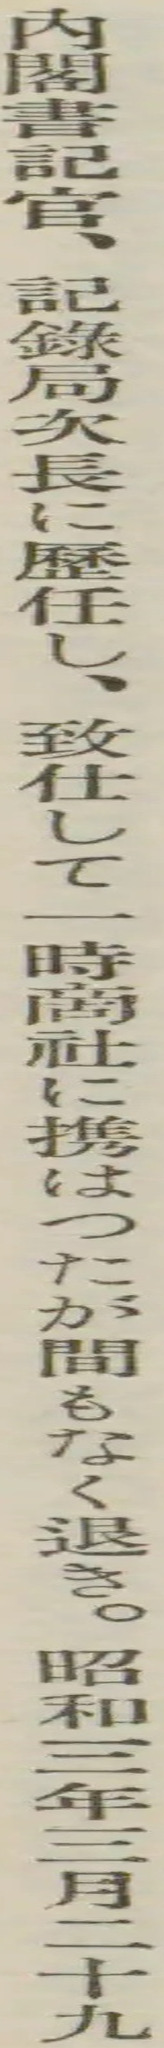内閣書記官、記録局次長に歴任し、致仕して一時啇社に携はつたが間もなく退き。昭和三年三月二十九
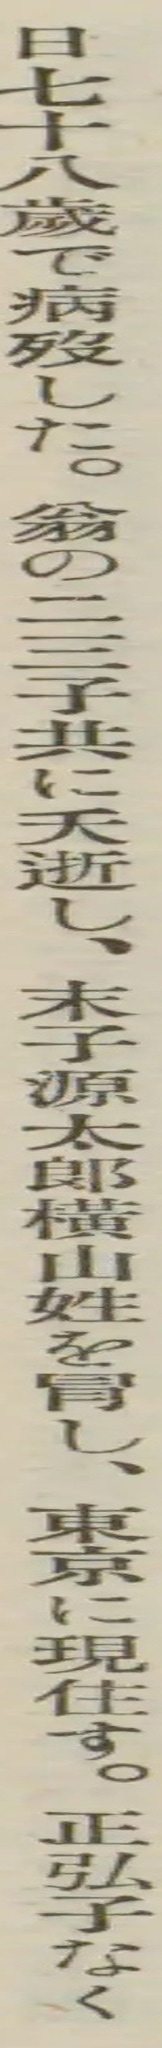日七十八歳で病歿した。翁の二三子共に夭逝し、末子源太郎横山姓を冒し、東京に現住す。正弘子なく

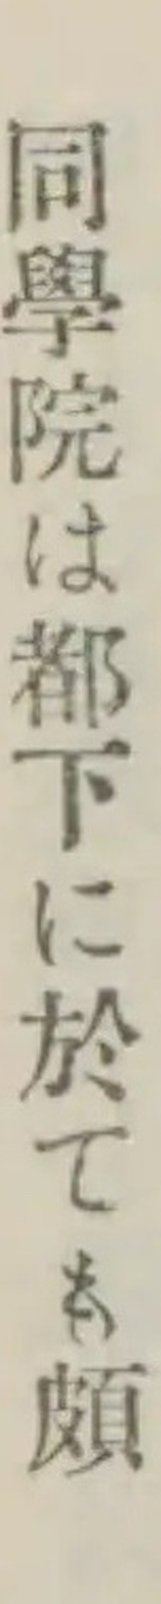同学院は都下に於ても頗
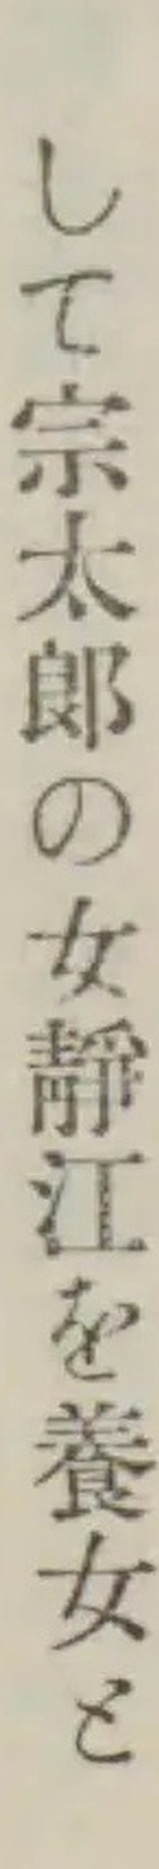して宗太郎の女静江を養女と
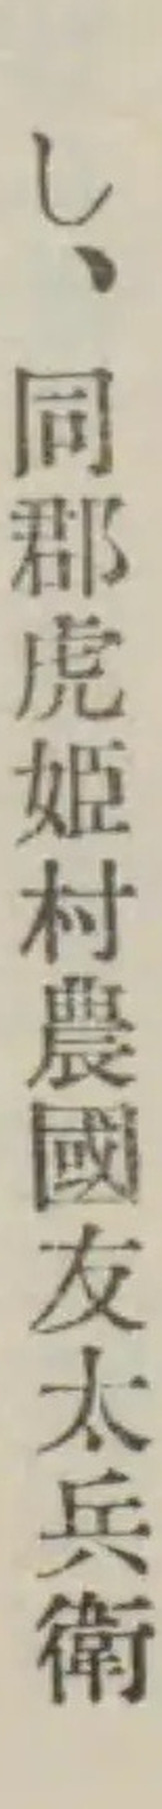し、同郡虎姫村農国友太兵衛
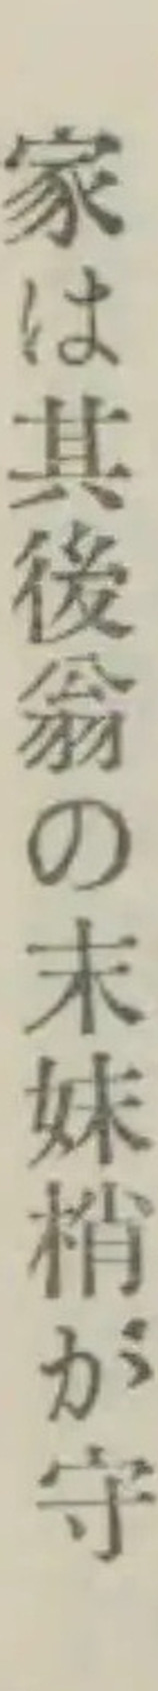家は其後翁の末妹梢が守
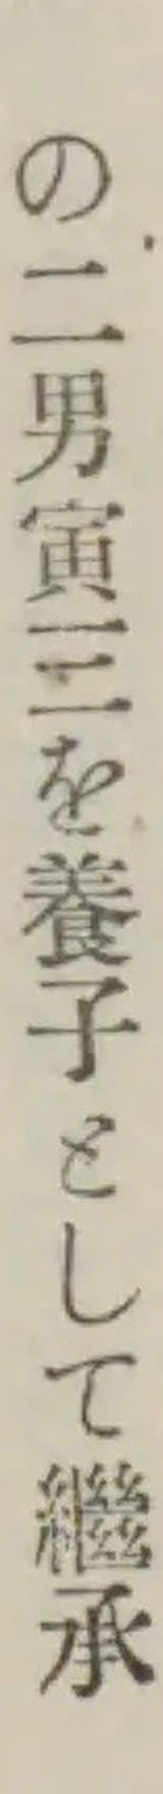の二男寅三を養子として継承
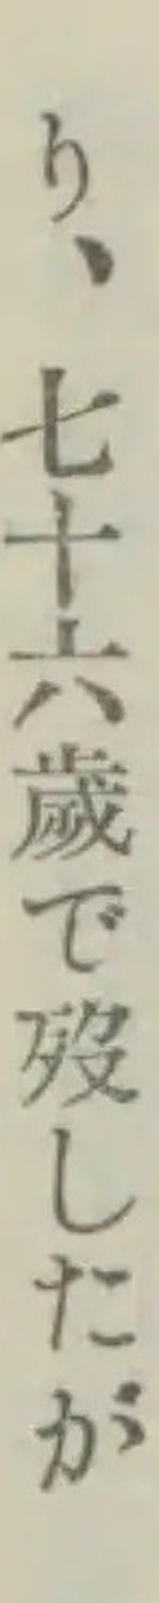り、七十六歳で歿したが
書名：小野湖山翁小伝
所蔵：国立国会図書館 National Diet Library, JAPAN
